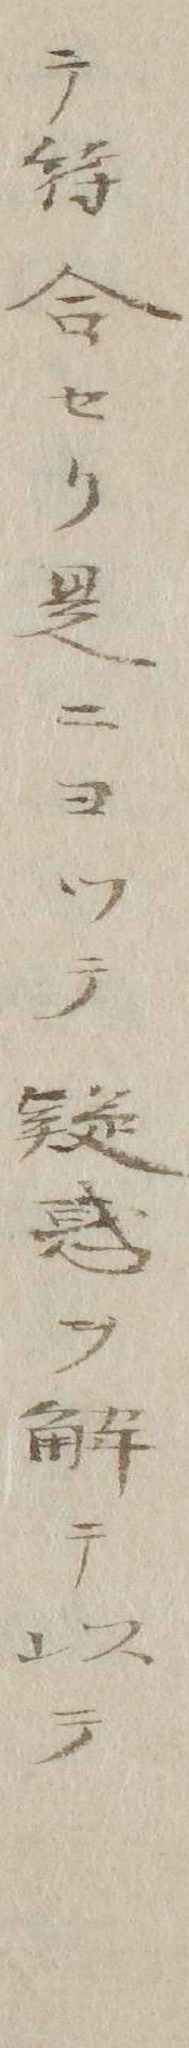テ符合セリ是ニヨツテ疑惑ヲ解テ以テ
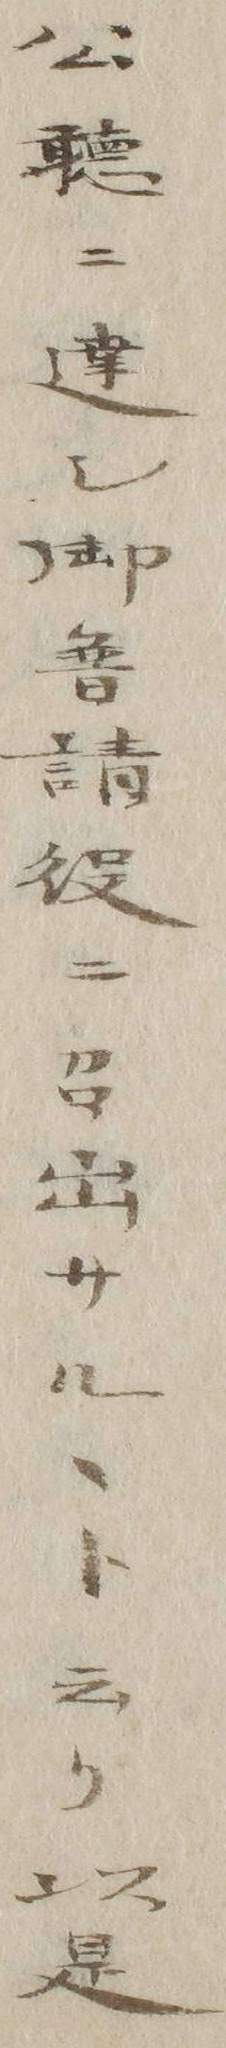公聴ニ達シ御普請役ニ召出サルヽト云リ以是
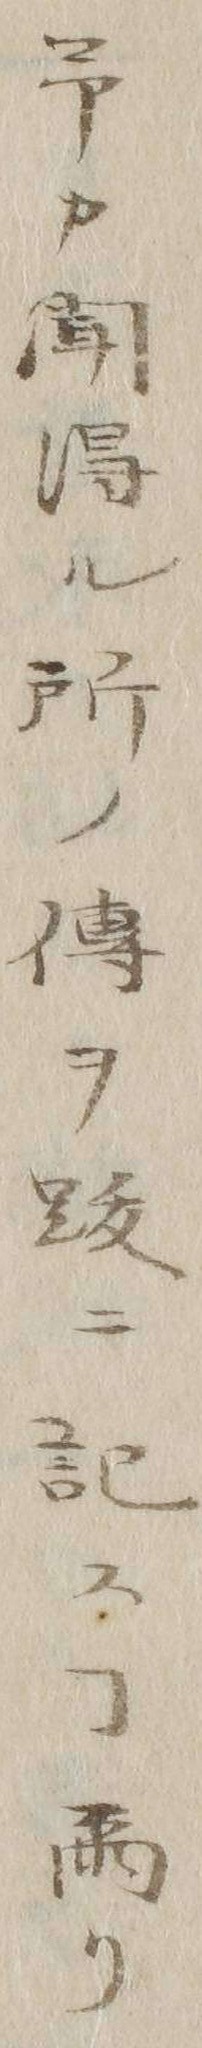予カ聞得ル所ノ伝ヲ跋ニ記スコト爾リ
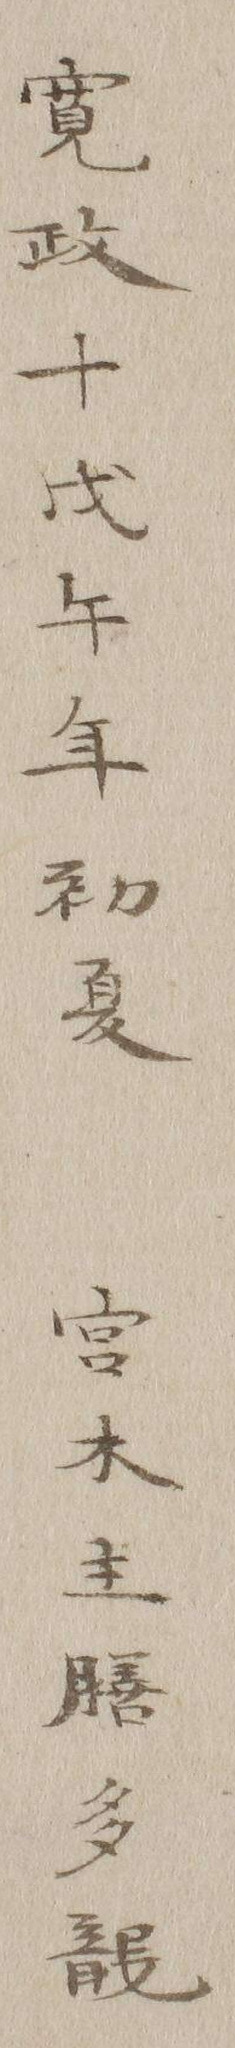寛政十戊午年初夏宮木主膳多龍
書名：蝦夷草紙（国文学研究資料館）
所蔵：国文学研究資料館
